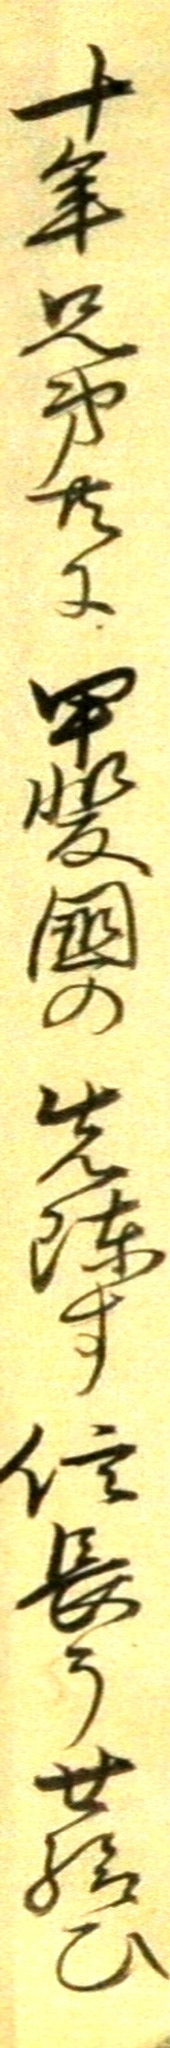十年兄弟共に甲斐国の先陣す信長うせ給ひ

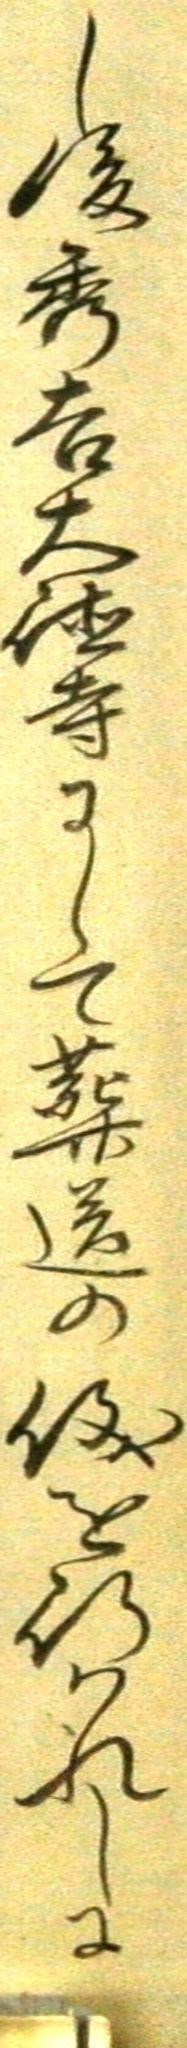し後秀吉大徳寺にして葬送の儀を行われしに
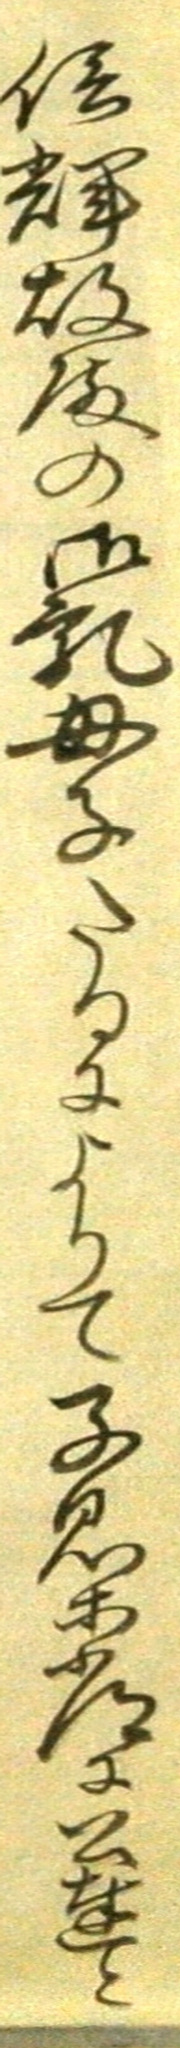信輝故殿の御乳母子たるによりて子息等常に公達と
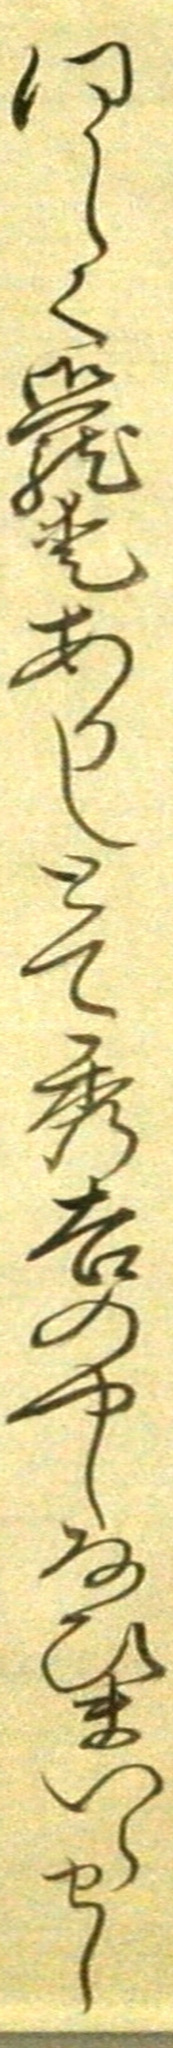同しく御寵愛ありしとて秀吉のやしなひまいらせし
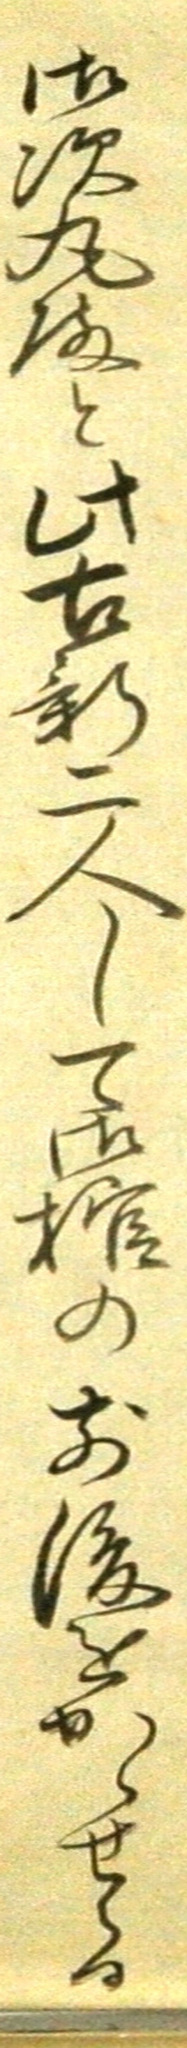御次丸殿と此古新二人して御棺の前後をかゝせらる
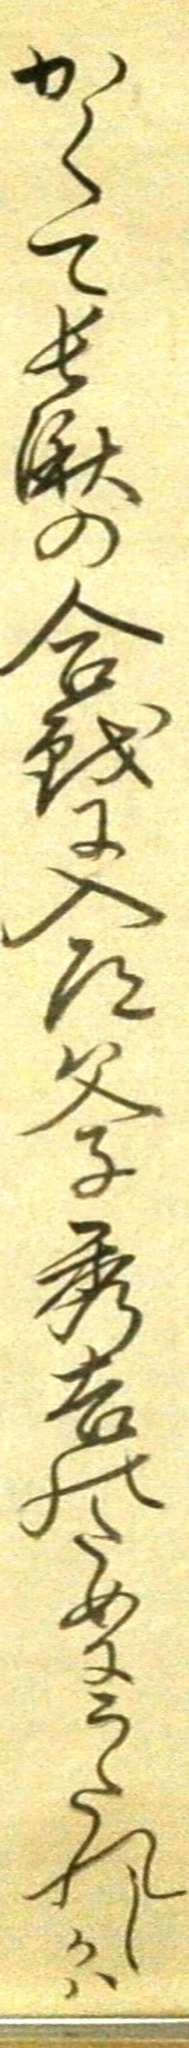かくて長湫の合戦に入道父子秀吉のためにうたれしかは
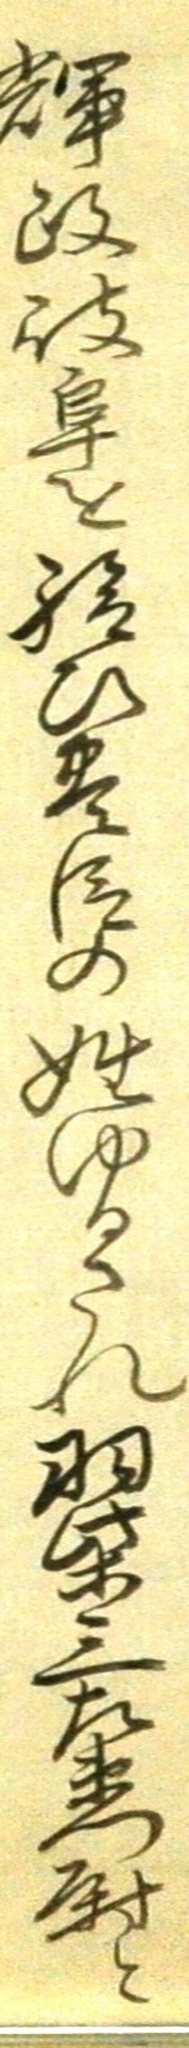輝政岐阜を給ひ豊臣の姓ゆるされ羽柴三左衛門尉と
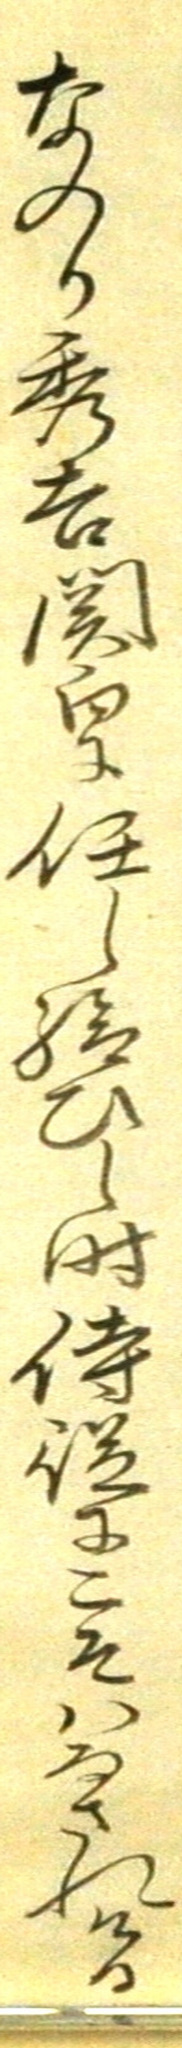なのり秀吉関白に任し給ひし時侍従にこそはなされける
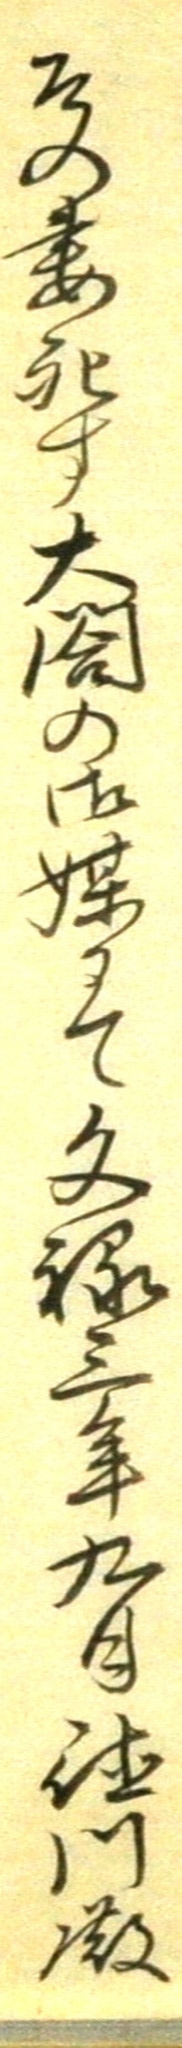その妻死す太閤の御媒にて文禄三年九月徳川殿
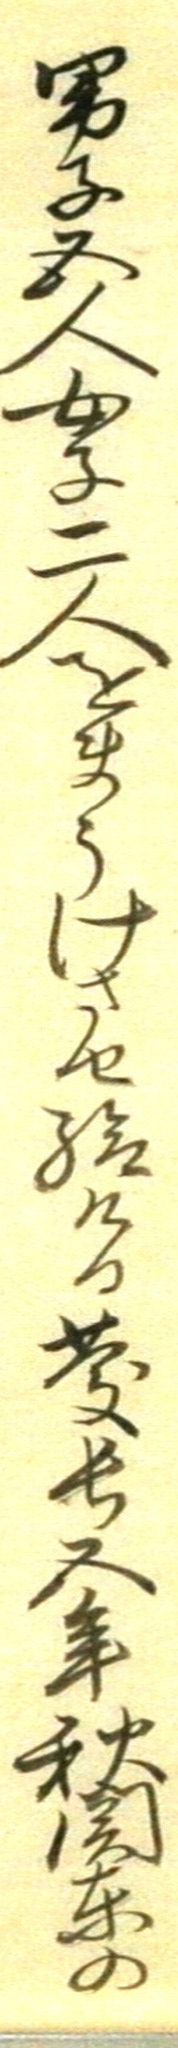男子五人女子二人をまうけさせ給ける慶長五年秋関東の
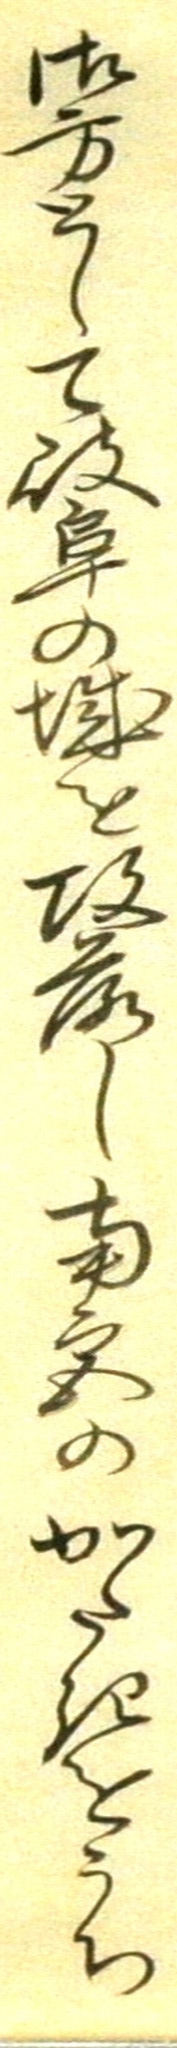御方として岐阜の城を攻落し南宮のかたきをうち
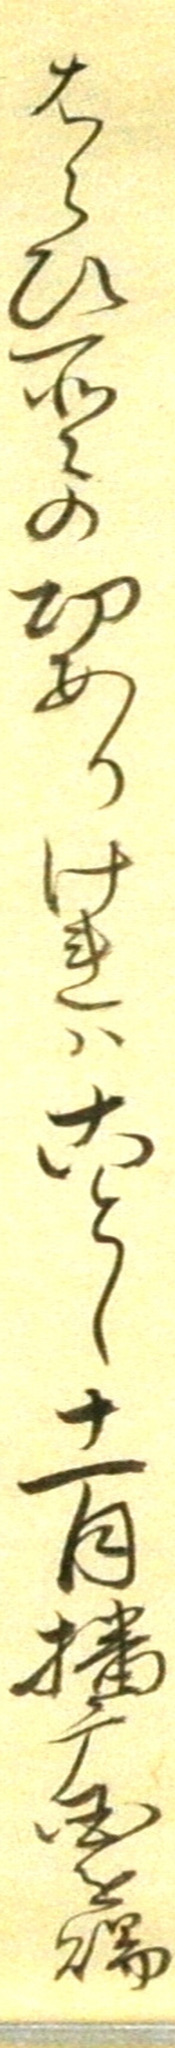はらひ所々の功ありけれはことし十一月播磨国を賜
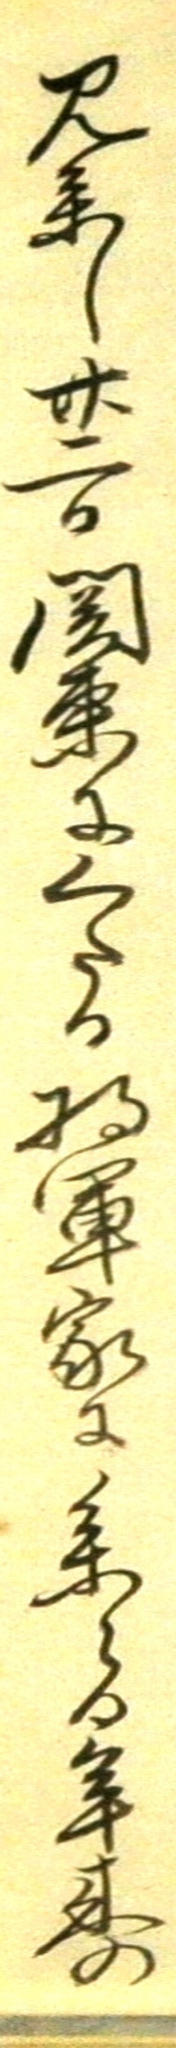見参し廿二日関東にくたる将軍家に参らる年来の
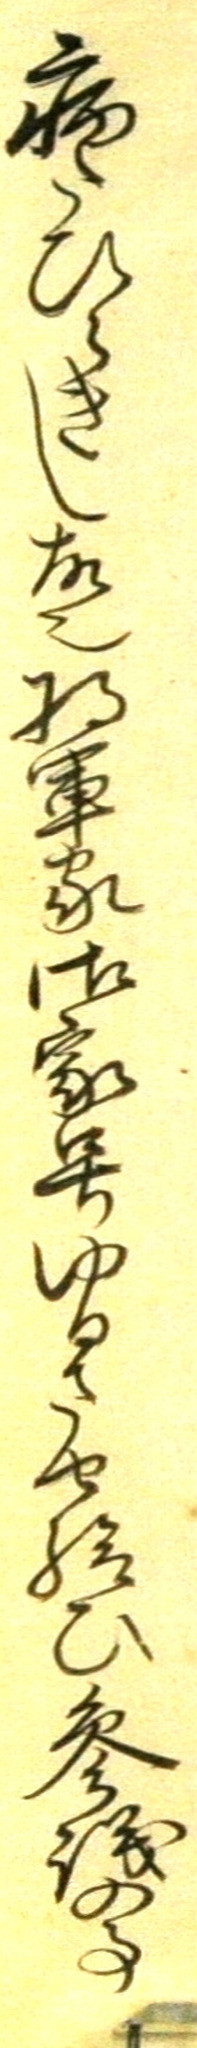病たひらきし故也将軍家御家号ゆるさせ給ひ参議の事

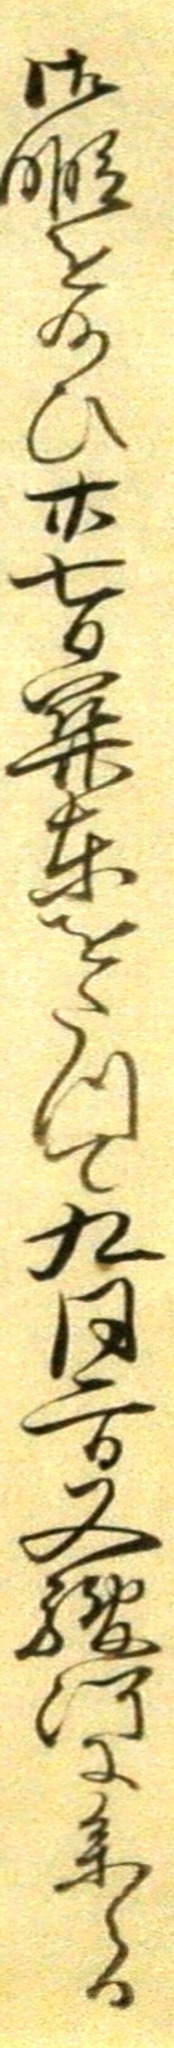御暇を給ひ廿七日関東をたつて九月二日又駿河に参らる
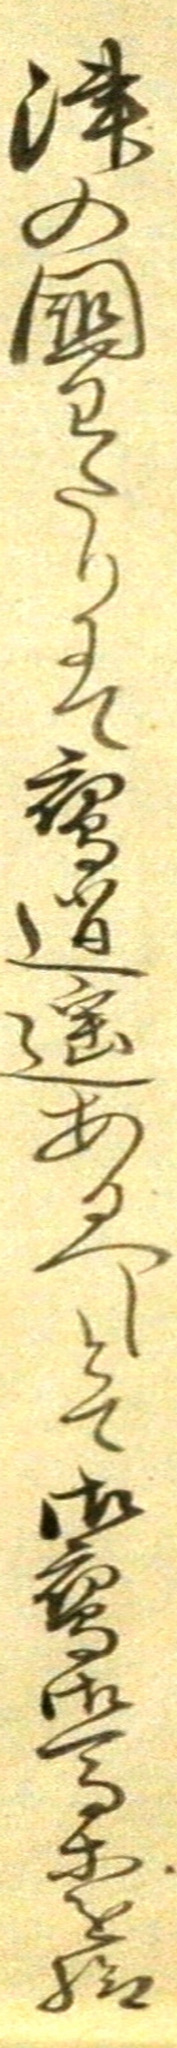津の国わたりにて鷹逍遥あるへしとて御鷹御馬等を給
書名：藩翰譜（七・上）
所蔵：伊那市立高遠町図書館・合同会社AMANE
